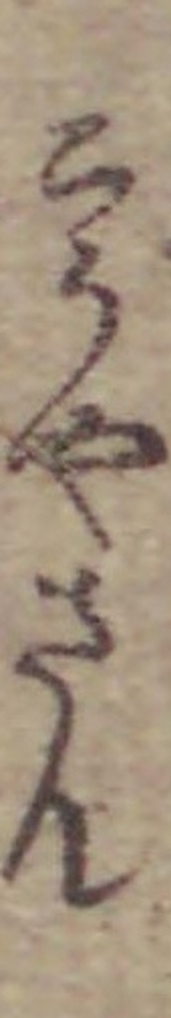こうやさん
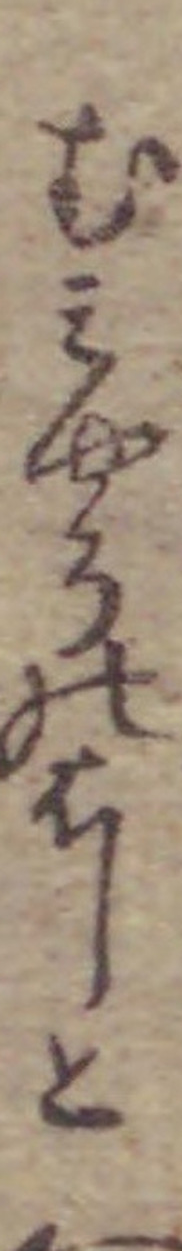むみやうのはしと
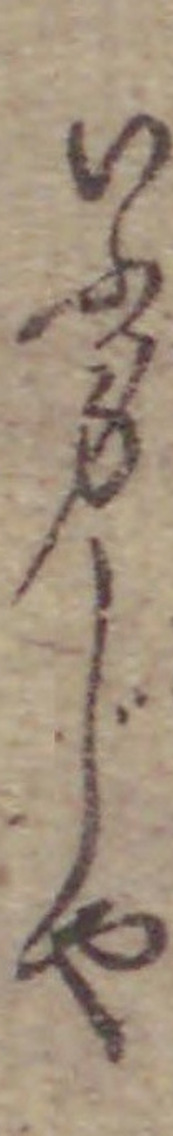いふ身じや

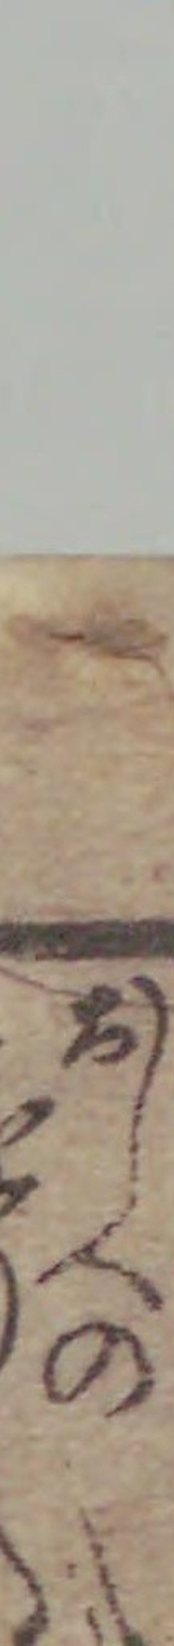おしへの
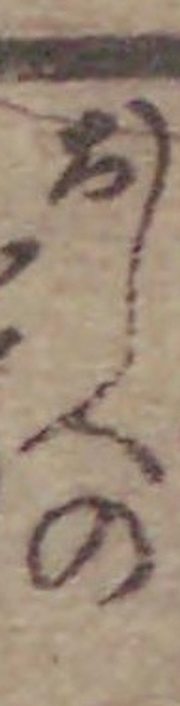おしへの
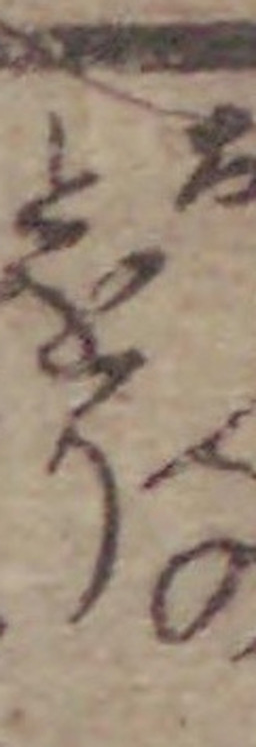とをり
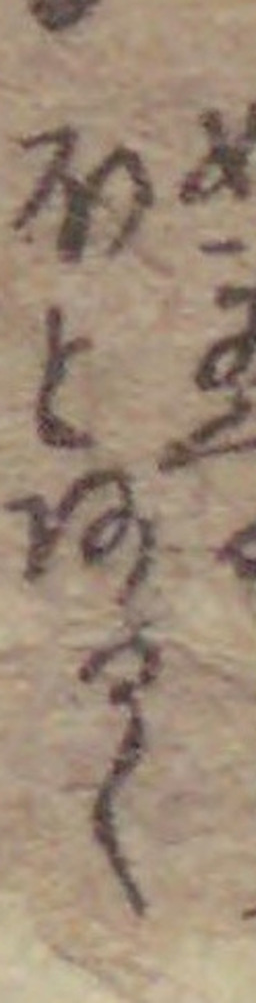ほとあるく
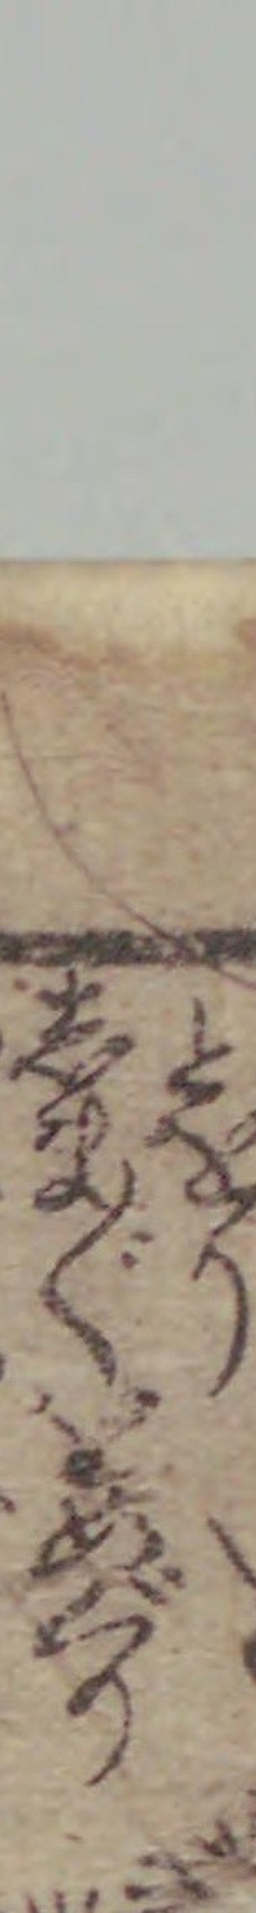しま〴〵をめぐり
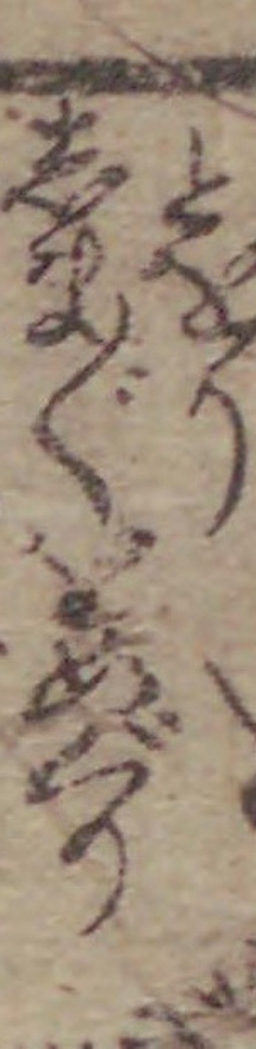しま〴〵をめぐり
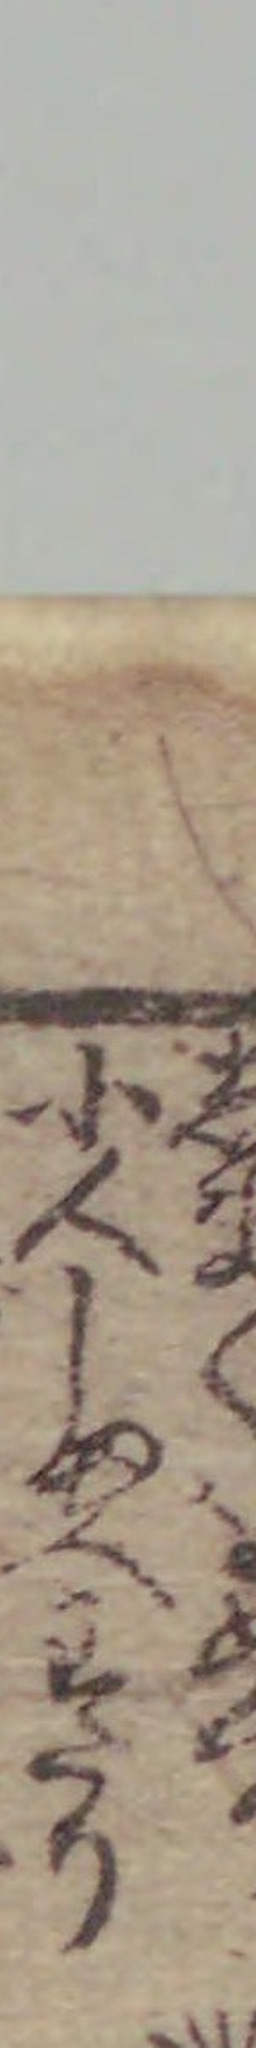小人しまへわたり
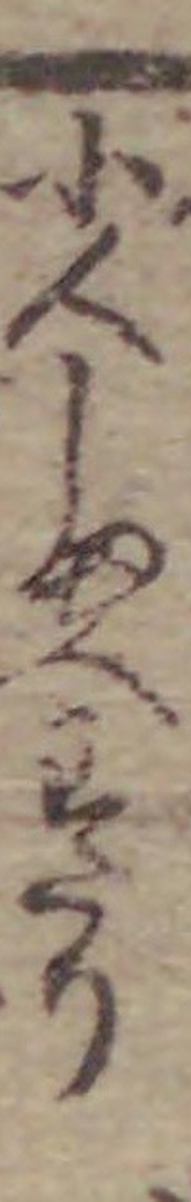小人しまへわたり
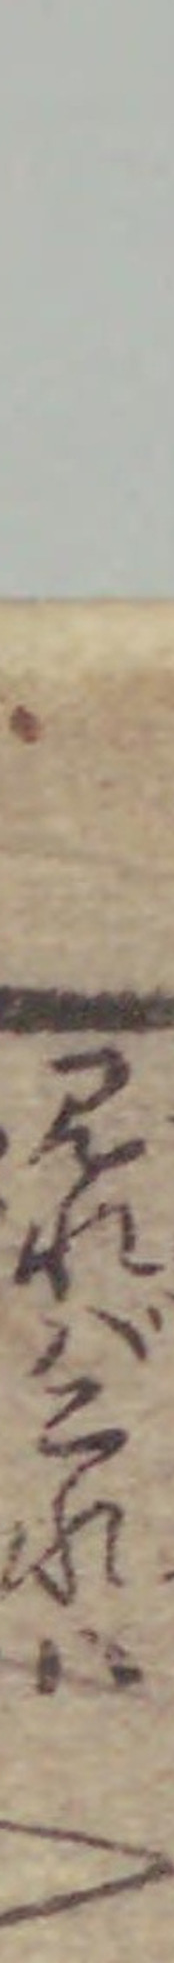見ればこれは
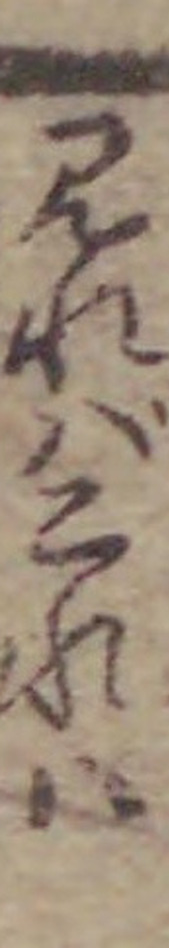見ればこれは
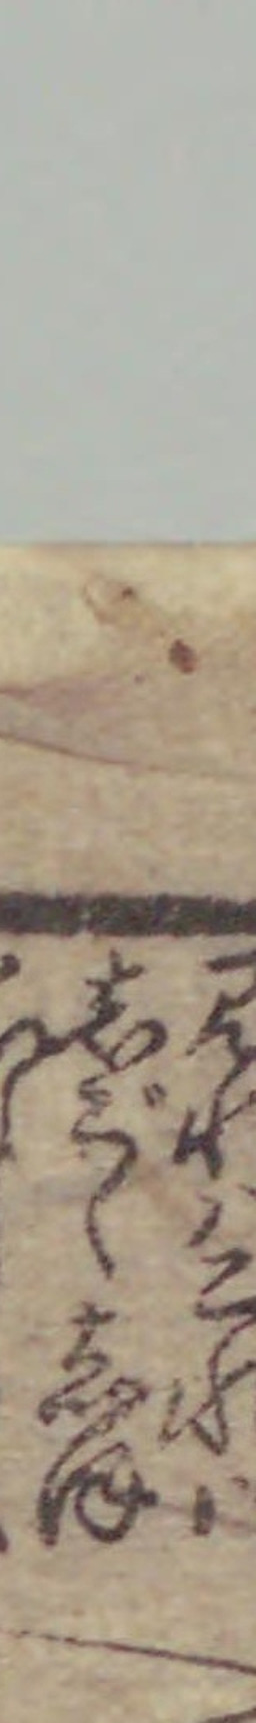しごくしま
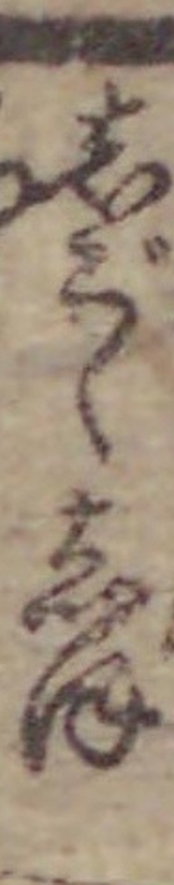しごくしま
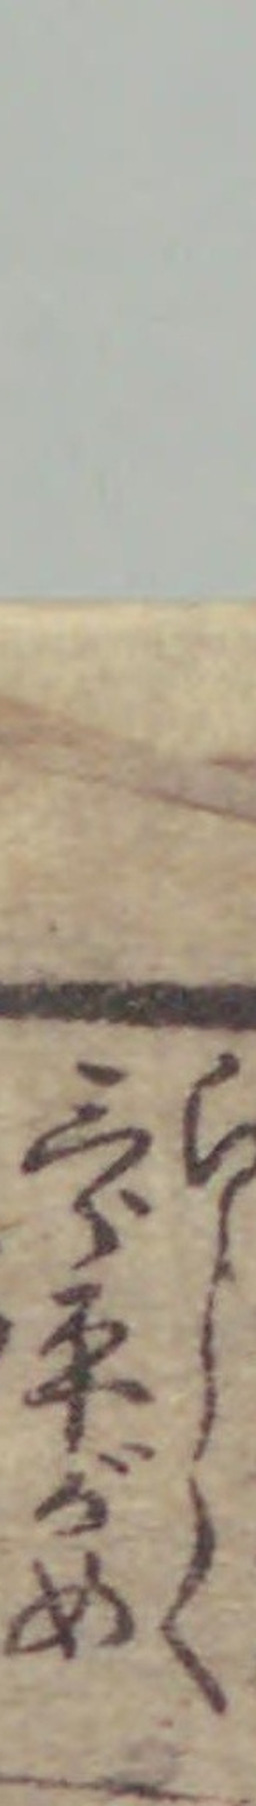三郎平がめ
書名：近頃嶋めぐり 3巻
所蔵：国立国会図書館 National Diet Library, JAPAN
